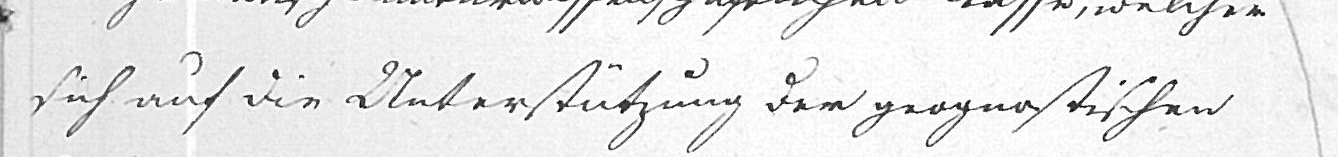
sich auf die Unterstützung der prognostischen
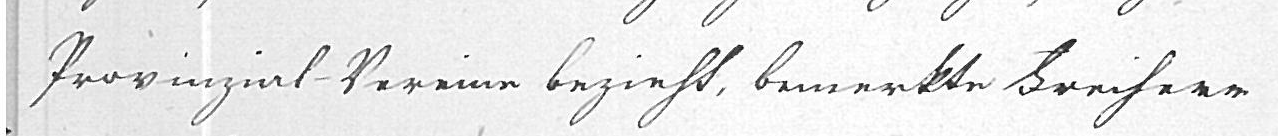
Provinzial-Vereine bezieht, bemerkte Freiherr
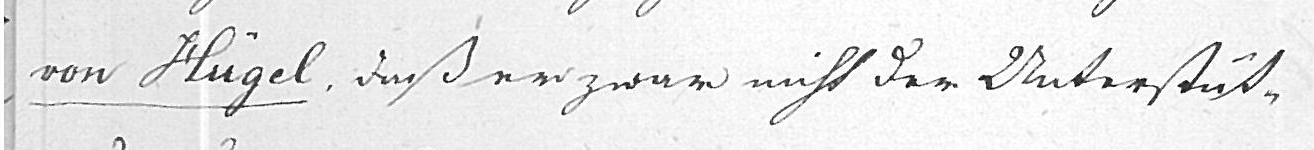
von Hügel, daß er zwar nicht der Unterstüt-
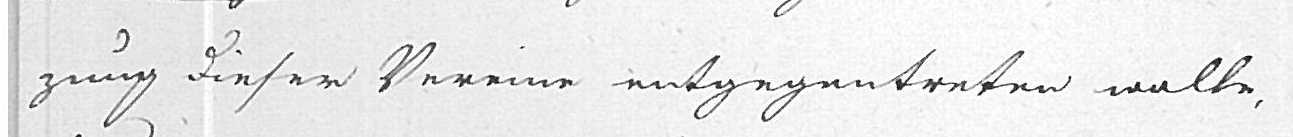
zung dieser Vereine entgegentreten wolle;
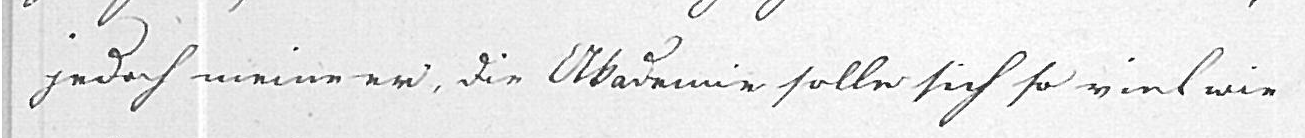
jedoch meine er, die Akademie solle sich so viel wie
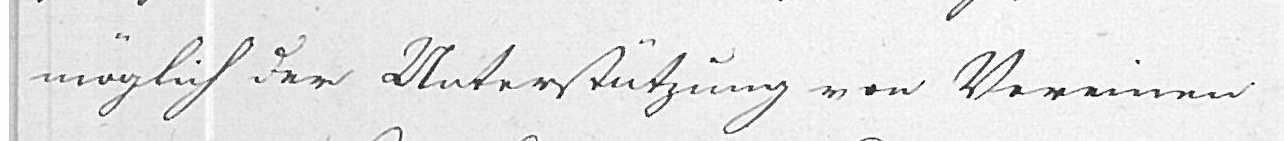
möglich der Unterstützung von Vereinen
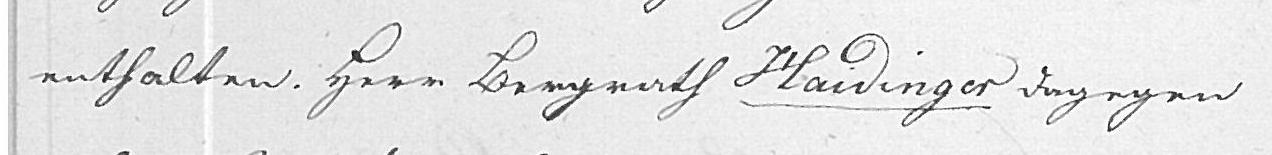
enthalten. Herr Bergrath Haidinger dagegen
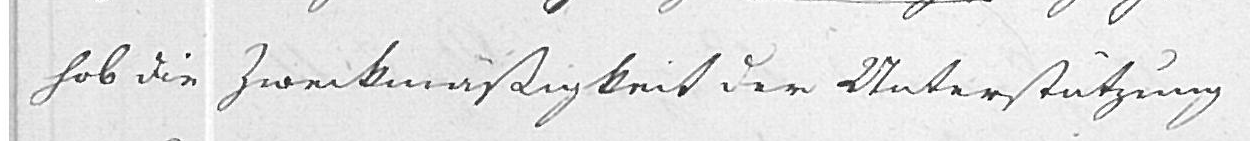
hob die Zweckmäßigkeit der Unterstützung
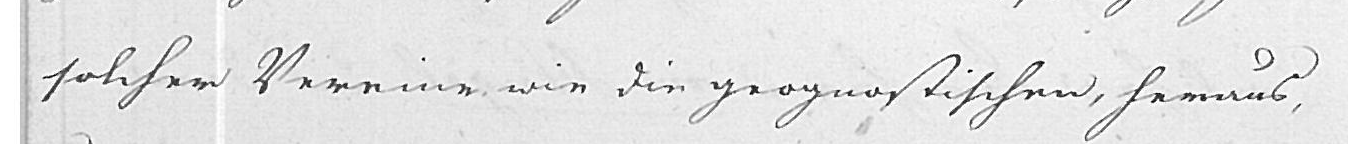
solcher Vereine wie die prognostischen, heraus,
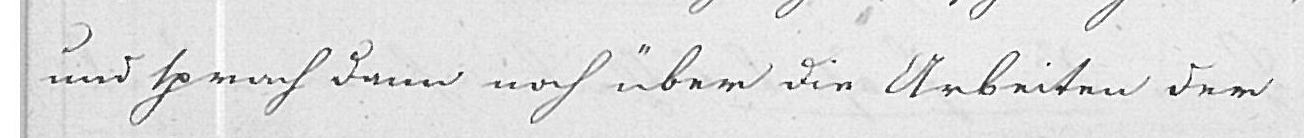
und sprach dann noch über die Arbeiten der
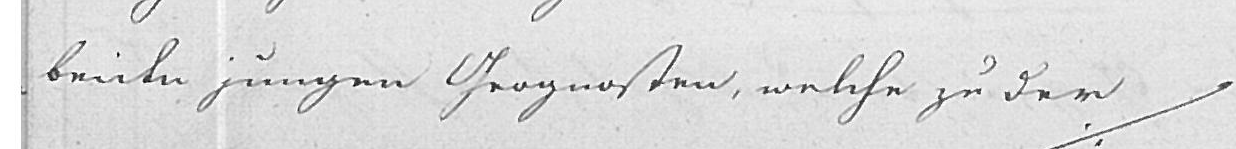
beiden jungen Geognosten, welche zu der
